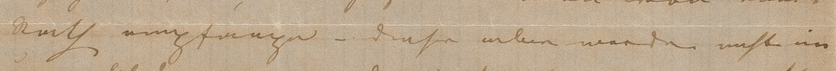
Rath empfange – dieser aber werde nicht im
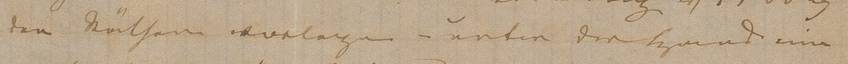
den Räthen vorlege – unter der Hand eine
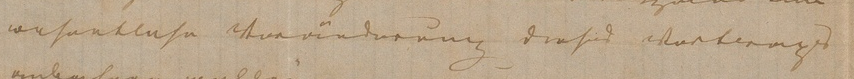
wesentliche Veränderung dieses Vertrags
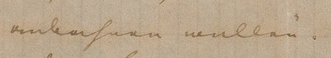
anbahnen wollen». –
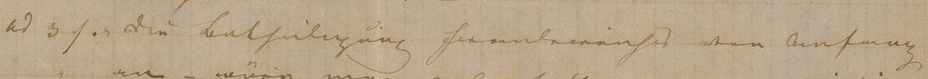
ad 3.) «Die Betheiligung Frankreichs von Anfang
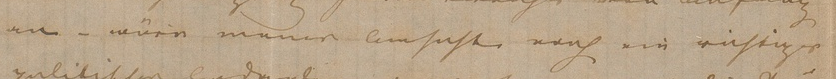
an – wäre meiner Ansicht nach ein wichtiger
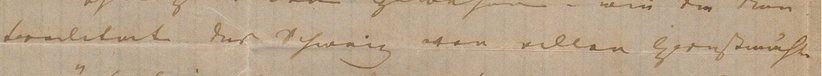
tralität der Schweiz von allen Großmächten
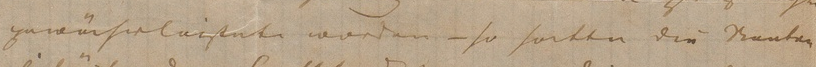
gewährleistet worden – so hatte die Neutra-
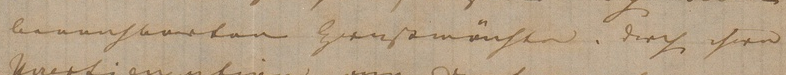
benachbarten Großmächte – durch ihre
